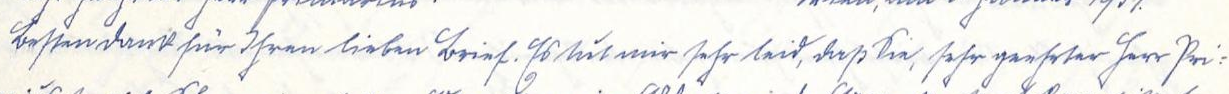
Besten Dank für Ihren lieben Brief. Es tut mir sehr leid, dass sie, sehr geehrter Herr Pri-
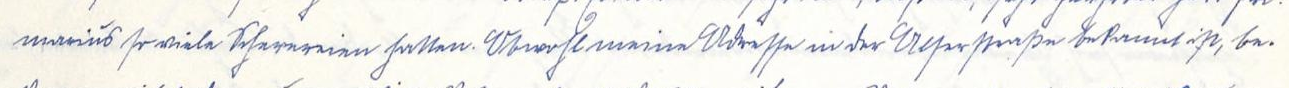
marius so viele Scherereien hatten. Obwohl meine Adresse in der Alserstraße bekannt ist, be-
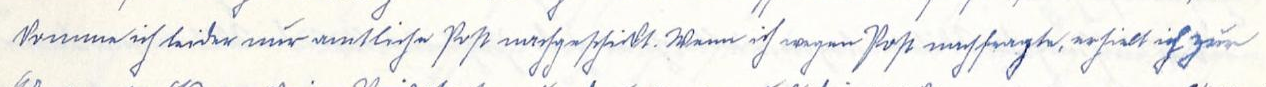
kommen ich leider nur amtliche Rost nachgeschickt. Wenn ich wegen Post nachfragte, erhielt ich zur
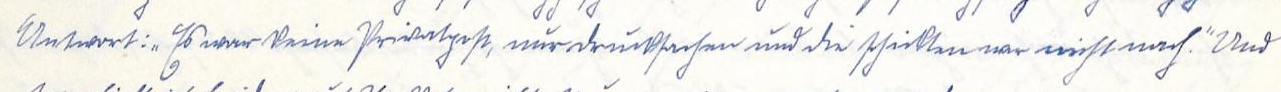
Antwort: „Es war keine Privatpost, nur Drucksachen und die schickten wir nicht nach. Und
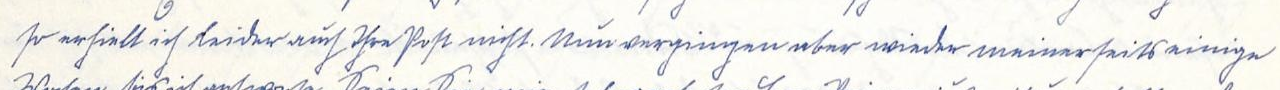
so erhielt ich leider auch Ihre Rost nicht. Nun vergingen aber wieder meinerseits einige
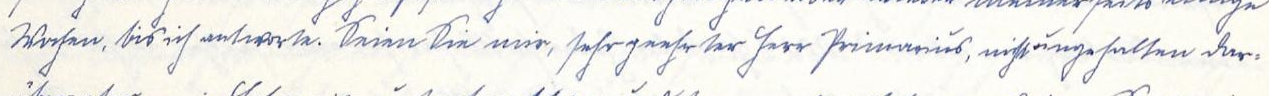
Wochen, bis ich antwortete. Seien Sie mir, sehr geehrter Herr Primarius, nicht ungehalten da-
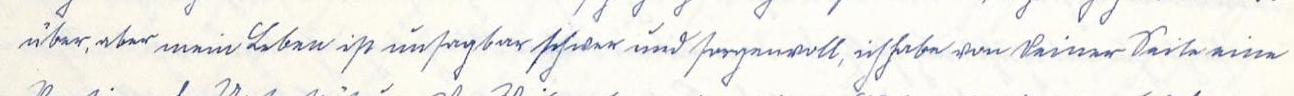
über, aber mein Leben ist unsagbar schwer und sorgenvoll, ichhabe von keiner Seite eine
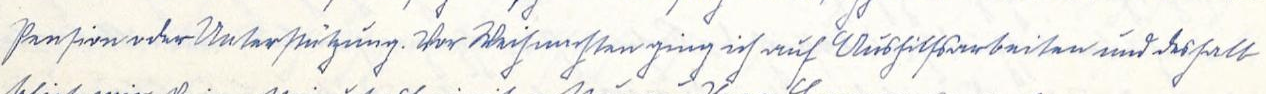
Pension oder Unterstützung. Vor Weihnachten ging ich auf Aushilfsarbeiten und deshalb
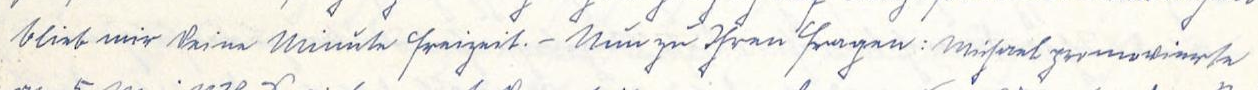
blieb mir keine Minute Freizeit. Nun zu Ihren Fragen: Michael promovierte
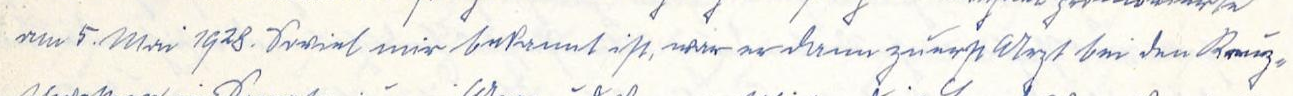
am 5. Mai 1928. Soviel mir bekannt ist, war er dann zuerst Arzt bei den Kreuz-
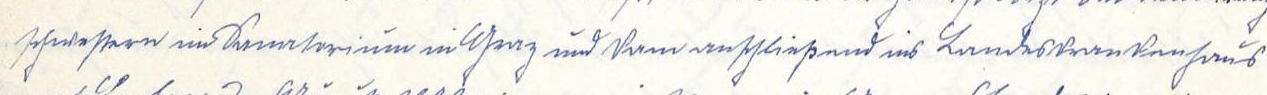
schwestern im Sanatorium in Graz und kam anschließend ins Landeskrankenhaus
